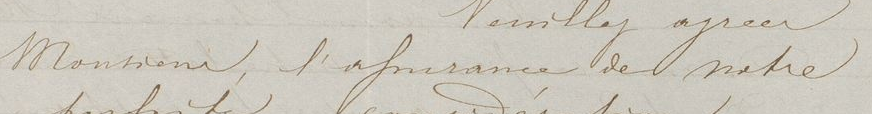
Monsieur, l'assurance de notre
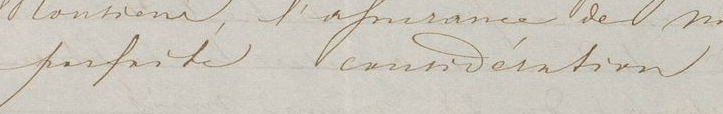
parfaite considération
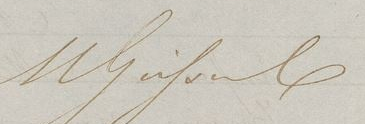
U Geisser C
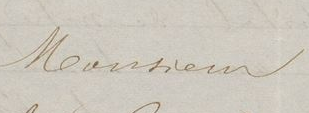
Monsieur
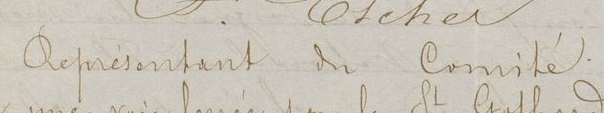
Représentant du Comité
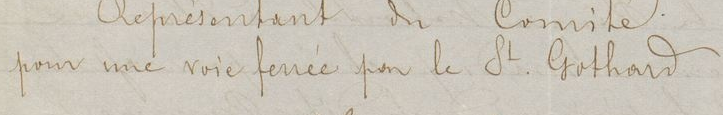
pour une voie ferrée par le St Gothard
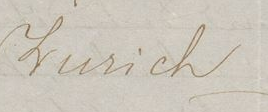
Zurich
